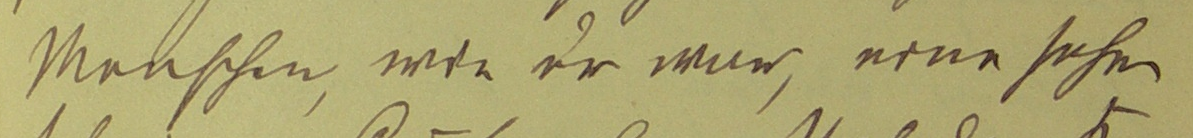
Menschen, wie er war, eine sehr
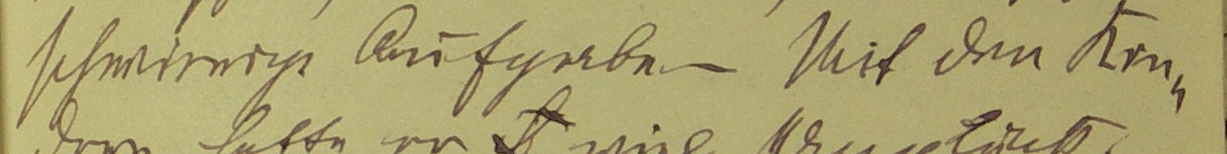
schwierige Aufgabe. - Mit den Kin¬
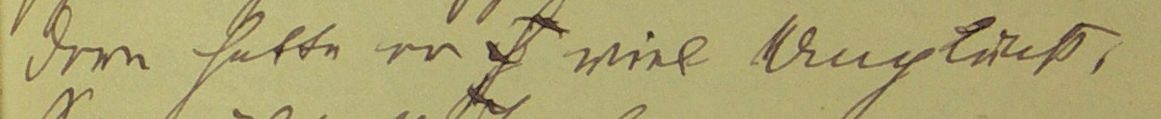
dern hatte er ??? viel Unglück.
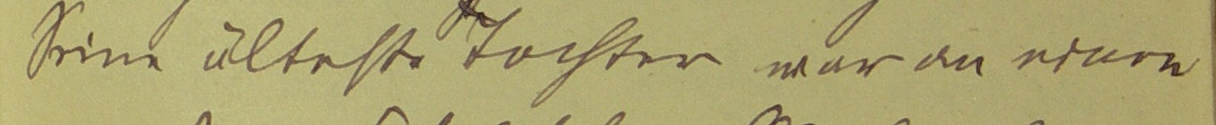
Seine älteste Tochter war an einen
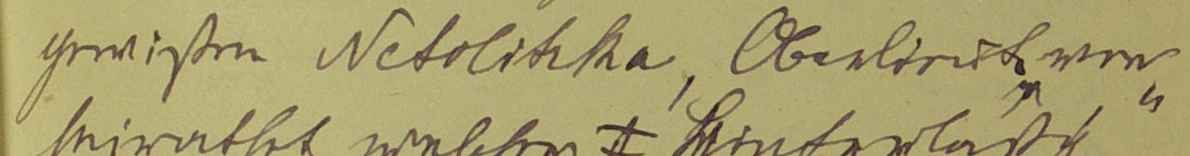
gewißen Netolitzka, Oberlieutenent ver¬
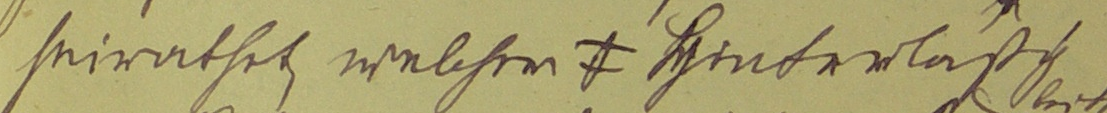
heirathet, welcher t Hinterlaßg
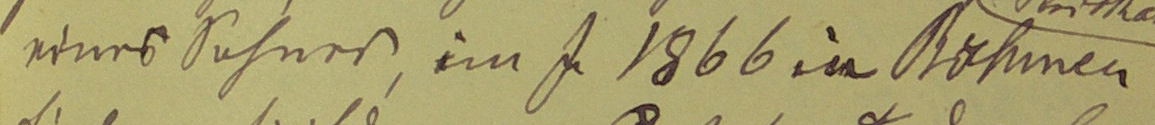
eines Sohnes, im J. 1866 in Böhmen
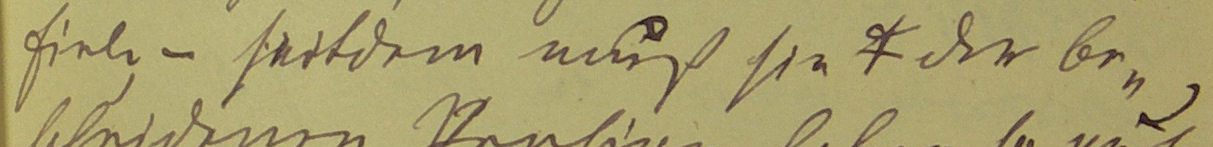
fiel, - seitdem muß sie t der be¬
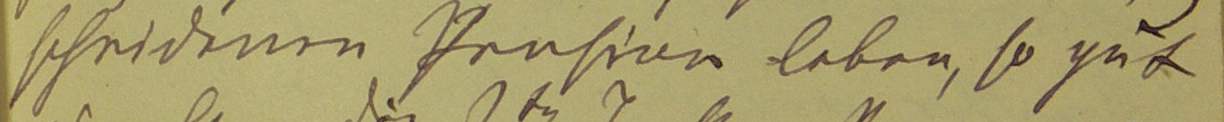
scheidenen Pension leben, so gut
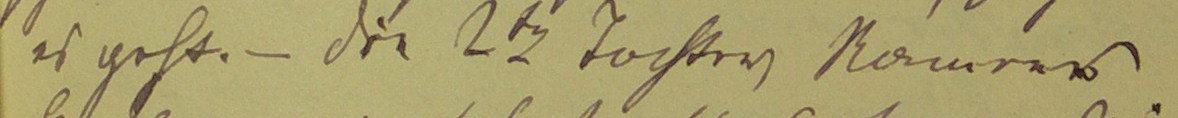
es geht.- Die 2-te Tochter Namens
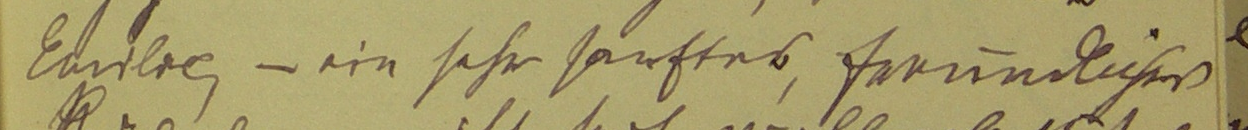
Emilie, - ein sehr sanftes, freundliches
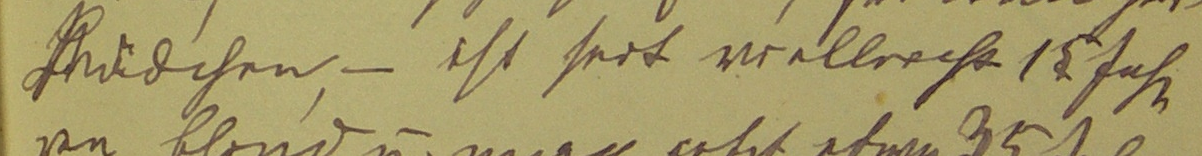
Mädchen,- ist seit vielleicht 15 Jah¬
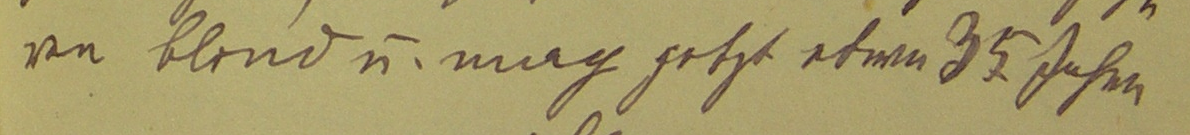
ren von blind und mag jetzt etwa 35 Jahre alt
